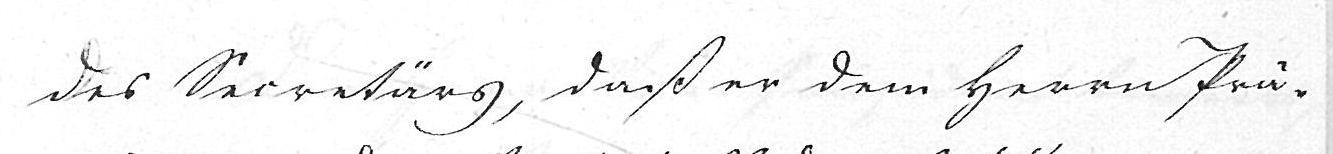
des Secretärs, daß er dem Herrn Prä-
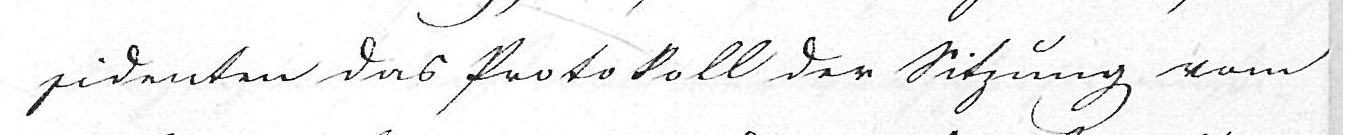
sidenten das Protokoll der Sitzung vom
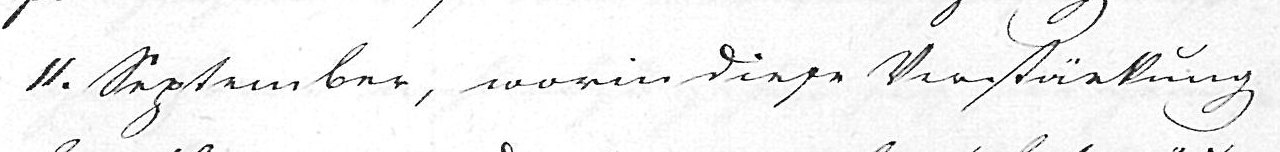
11. Septenber, worin diese Verstärkung
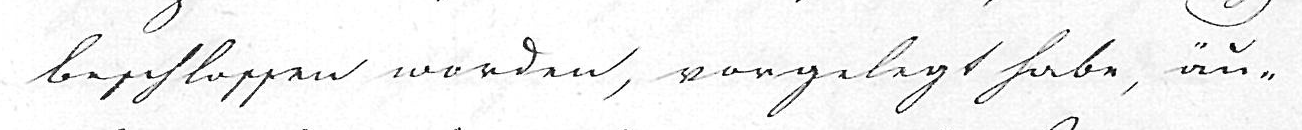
beschlossen worden, vorgelegt habe, äu-
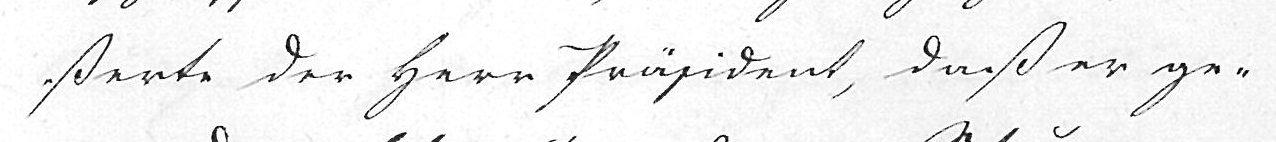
ßerte der Herr Präsident, daß er ge-
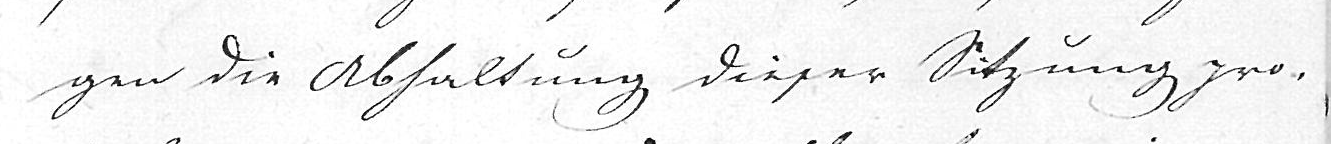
gen die Abhaltung dieser Sitzungen pro-
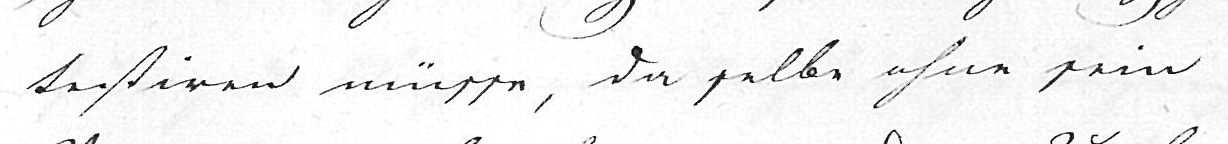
testiren müsse, da selbe ohne sein
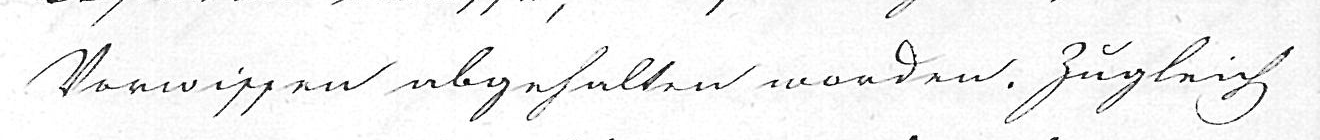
Verwissen abgehalten worden. Zugleich
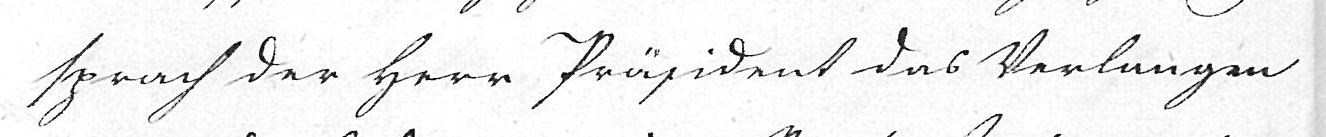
sprach der Herr Präsident das Verlangen
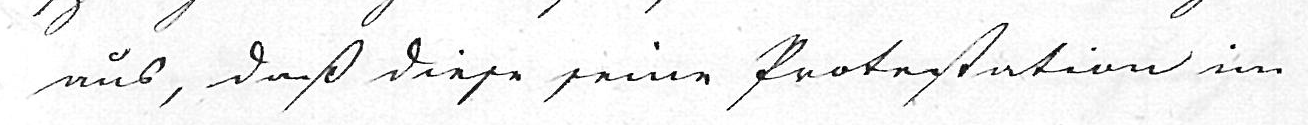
aus, daß diese seine Protestation im
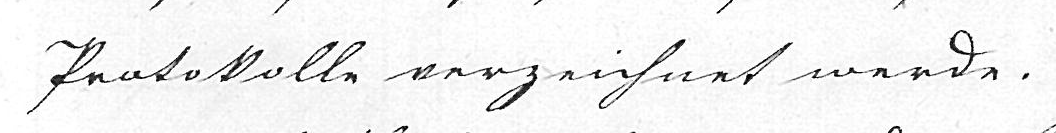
Protokolle verzeichnet werde
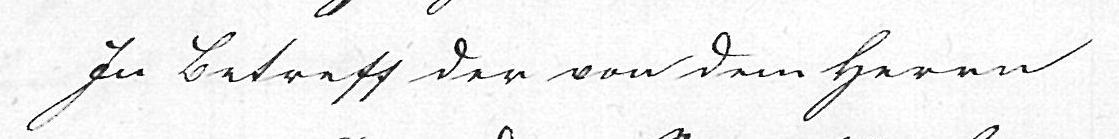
In Betreff der von dem Herrn
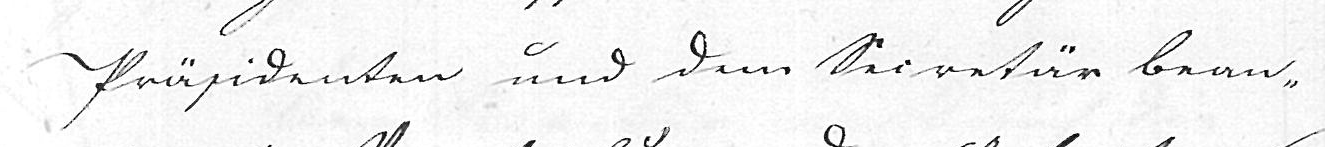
Präsidenten und dem Secretär bean-
